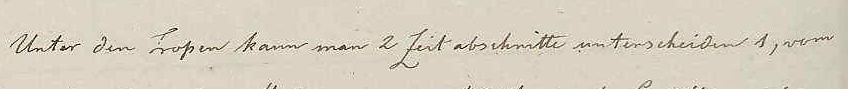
Unter den Tropen kann man 2 Zeitabschnitte unterscheiden 1, vom
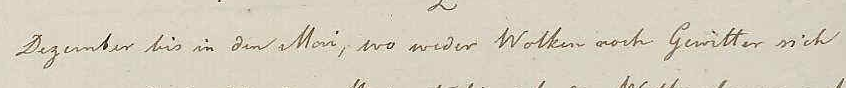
Dezember bis in den Mai, wo weder Wolken noch Gewitter sich
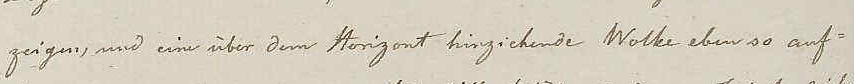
zeigen, und eine über dem Horizont hinziehende Wolke eben so auf-
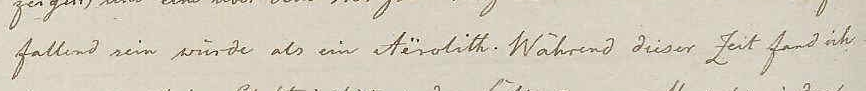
fallend sein würde als ein Aërolith. Während dieser Zeit fand ich
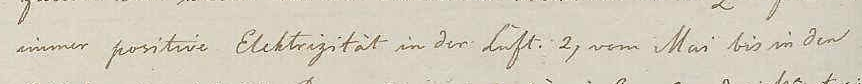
immer positive Elektrizität in der Luft. 2, vom Mai bis in den
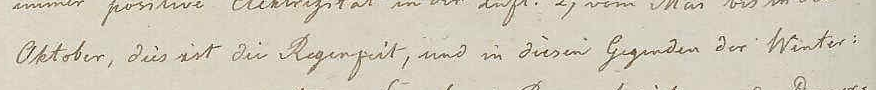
Oktober, dies sist die Regenzeit, und in diesen Gegenden der Winter:
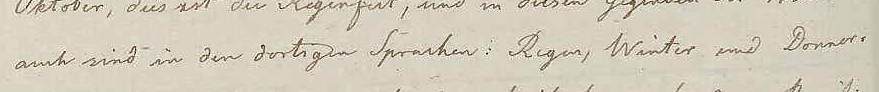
auch sind in den dortigen Sprachen: Regen, Winter und Donner-
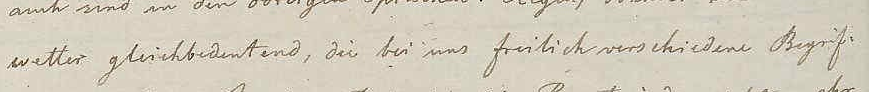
wetter gleichbedeutend, die bei uns freilich verschiedene Begrif-
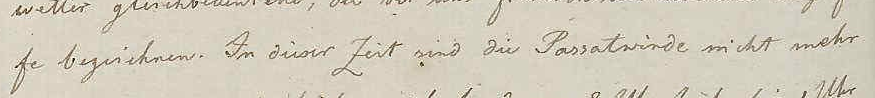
fe bezeichnen. In dieser Zeit sind die Passatwinde nicht mehr
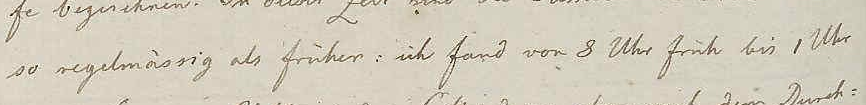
so regelmässig als früher: ich fand von 8 Uhr früh bis 1 Uhr
